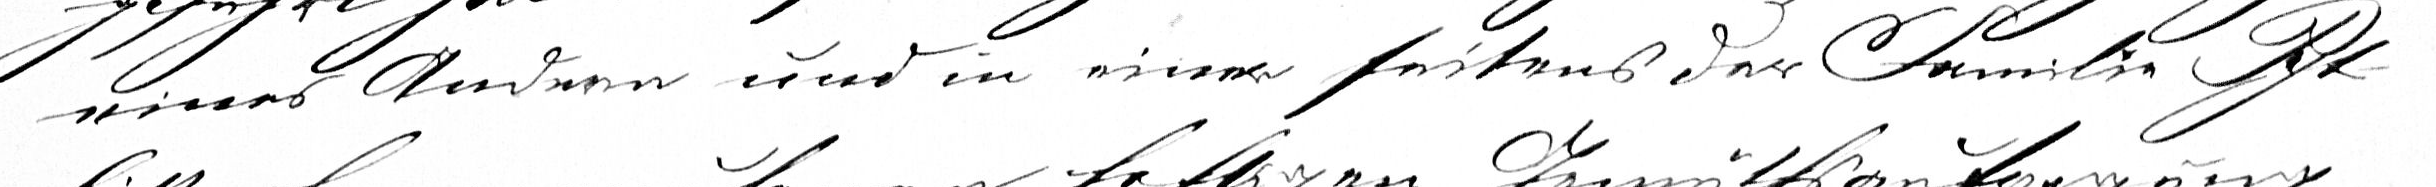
eines Andern und in einer seitens der Familie Pyt¬
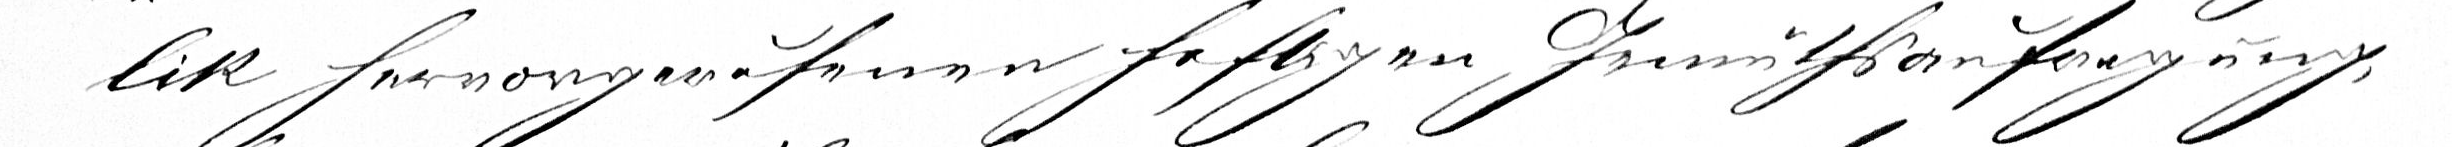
lik hervorgerufenen festigen Gemuthsaufregung,
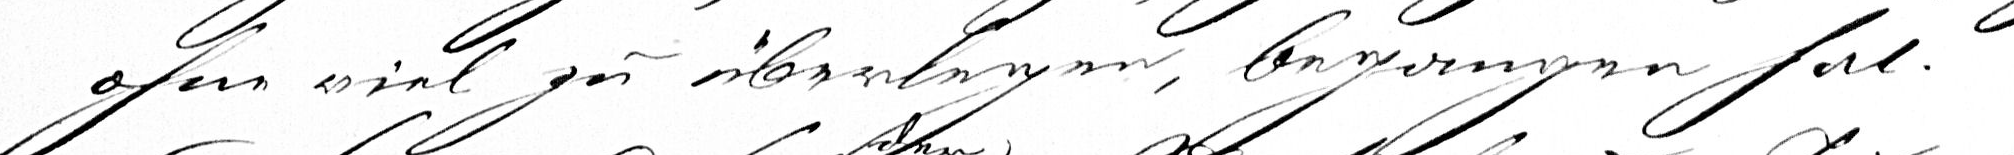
ohne viel zu überlegen, begangen hat.
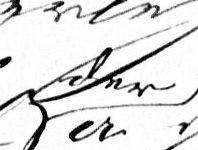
der
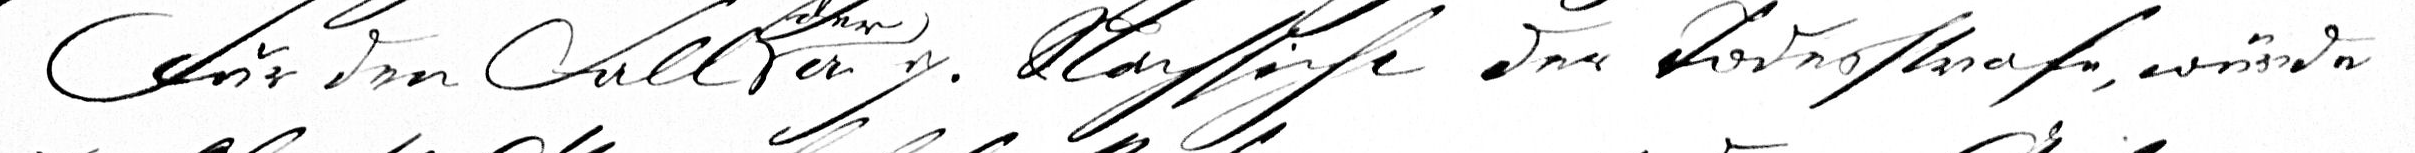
Für den Fall a. g. Nachsicht der Todesstrafe, würde
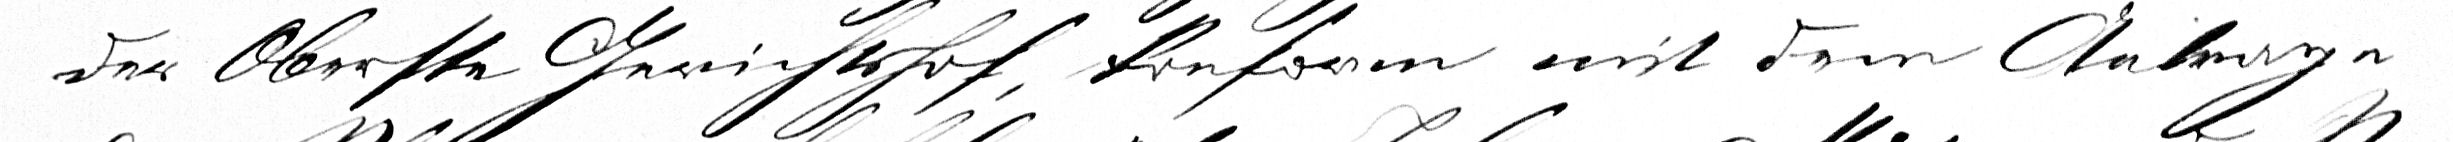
der Oberste Gerichtshof, konform mit dem Antrage
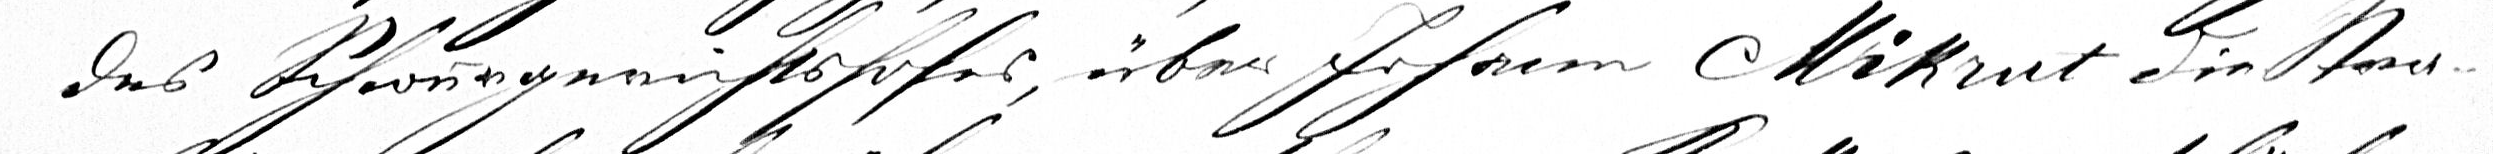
des Schwurgerichtshofes, über Johann Mikrut die Stra¬
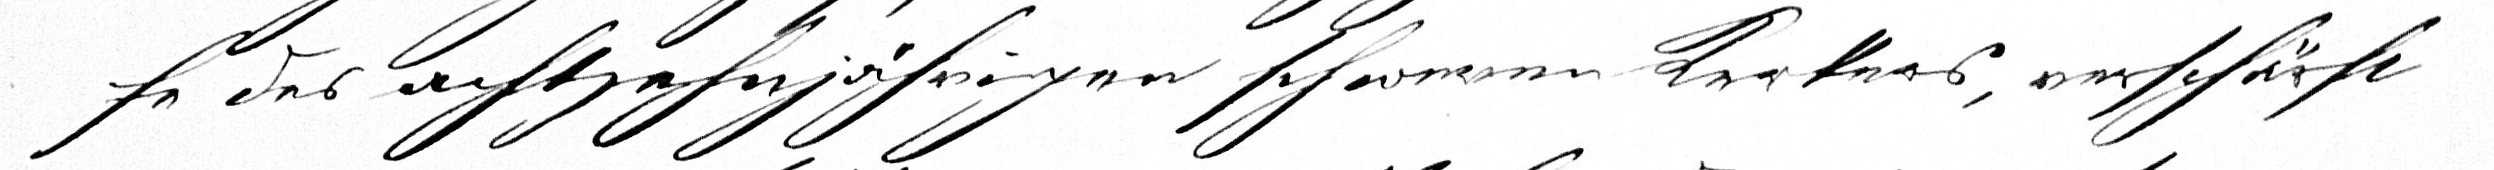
fe des achtzehnjährigen schweren Kerkers, verschärft
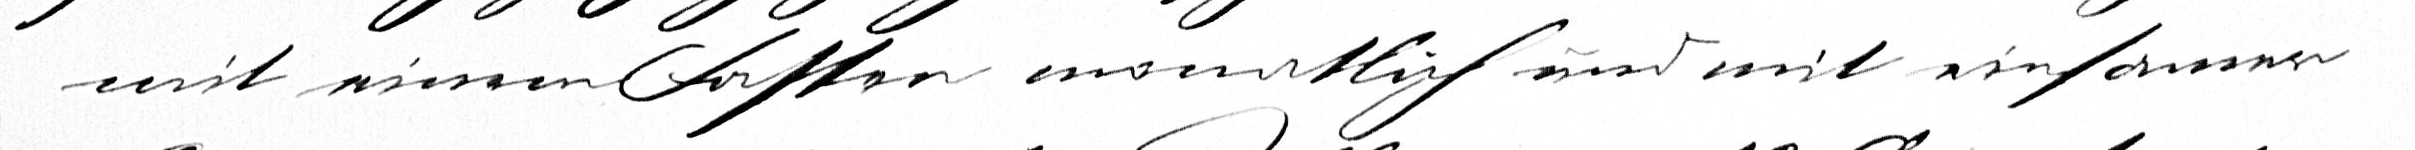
mit einem Fasten monatlich und mit einsamer
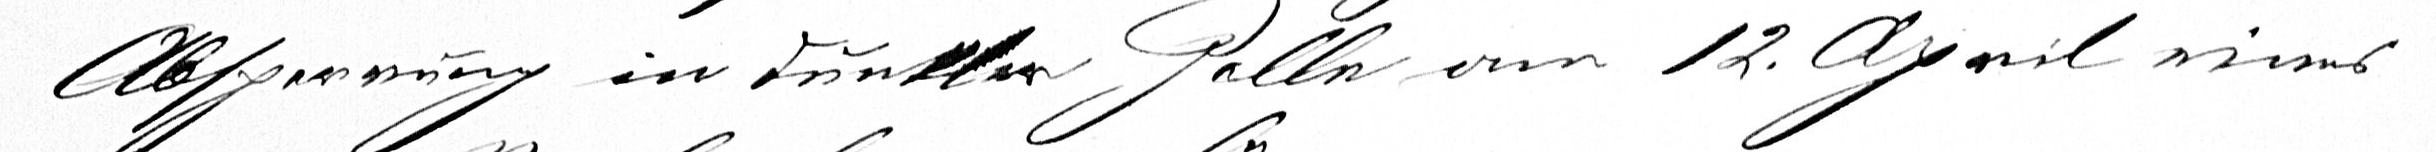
Absperrung in dunkler Zelle am 12. April eines
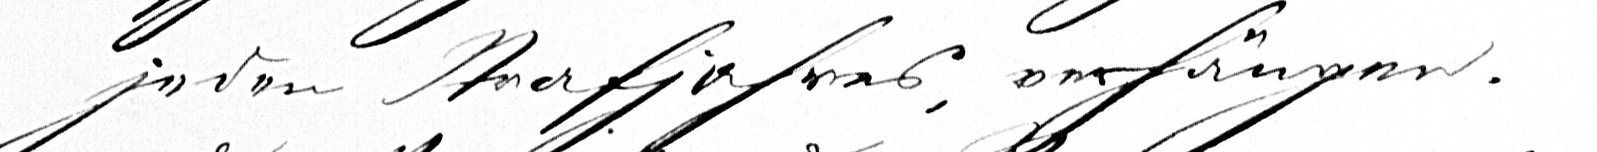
jeden Strafjahres, verhängen.
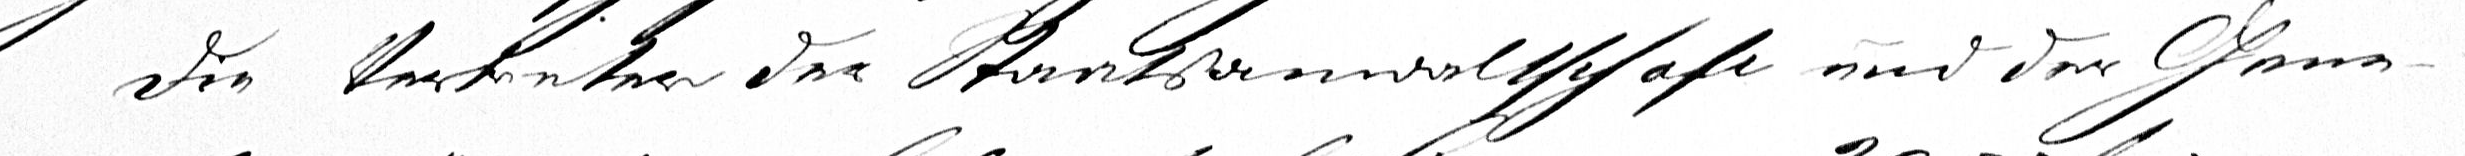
Die Vertreter der Staatsanwaltschaft und der Gene¬
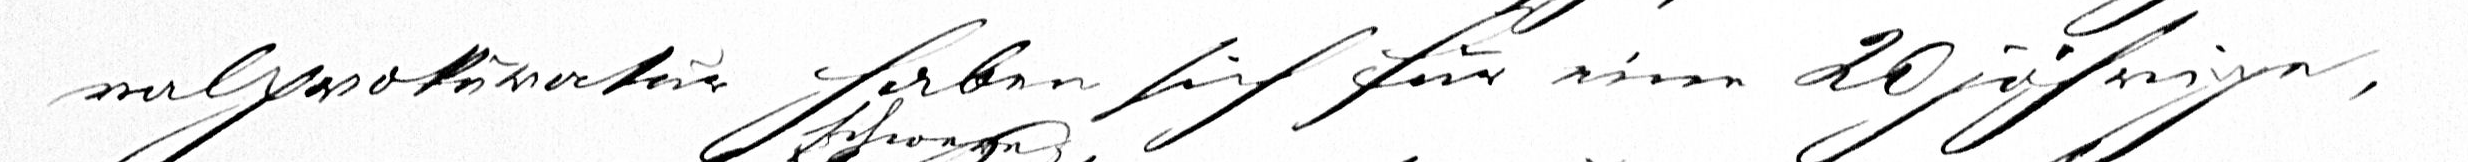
ralprokuratur haben sich für eine 20jährige,
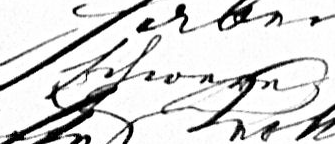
schwere
